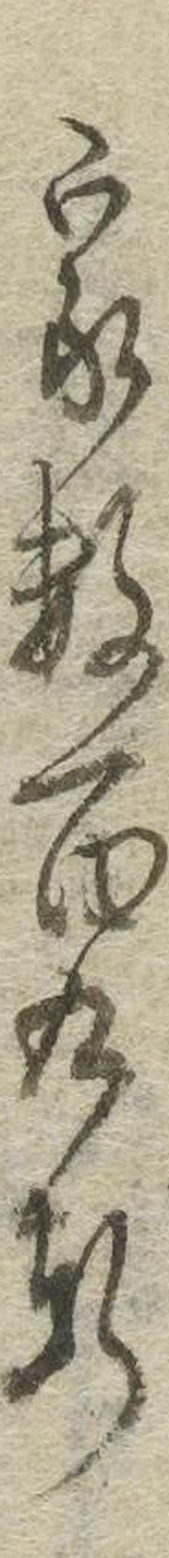家数百九軒
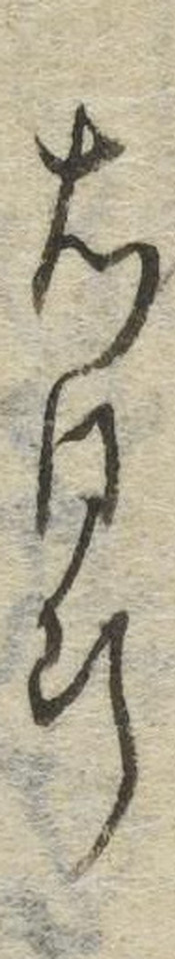右同断
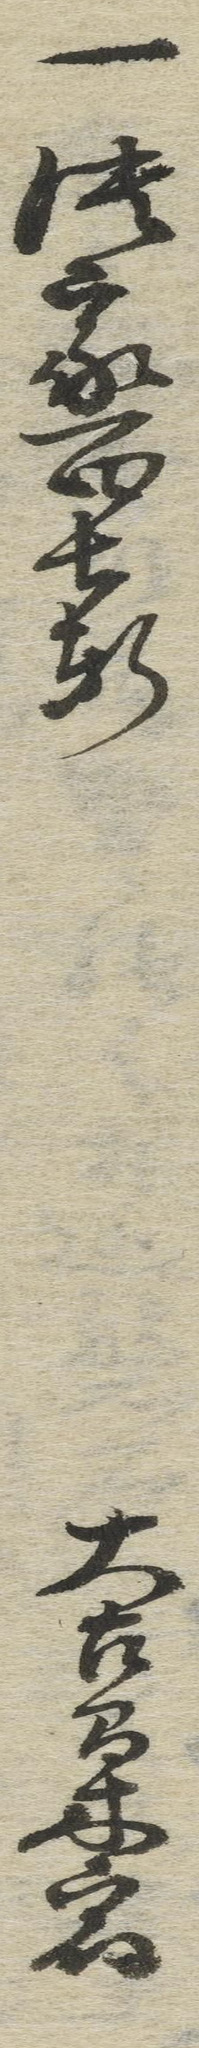一潰家数百七軒大古間宿
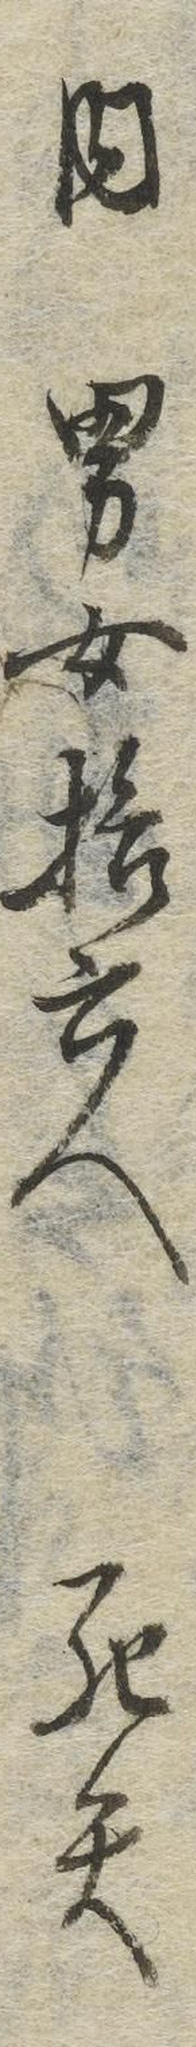内男女拾六人死失
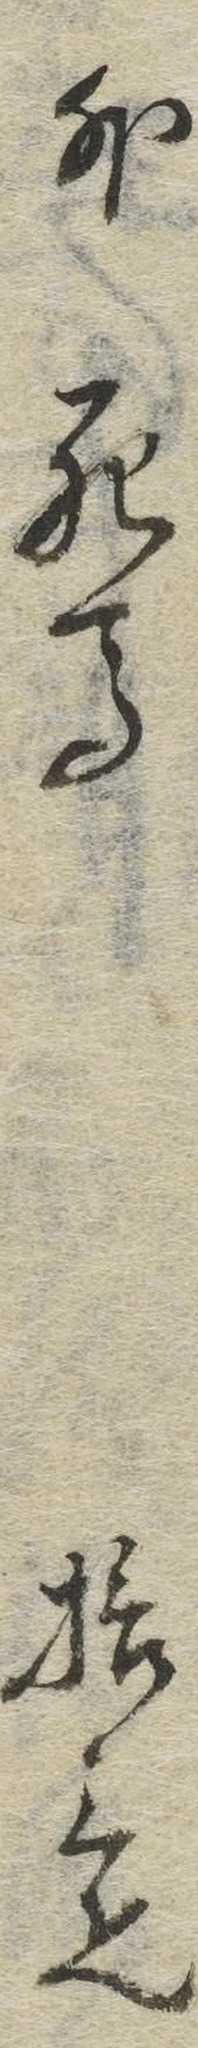外死馬拾三疋
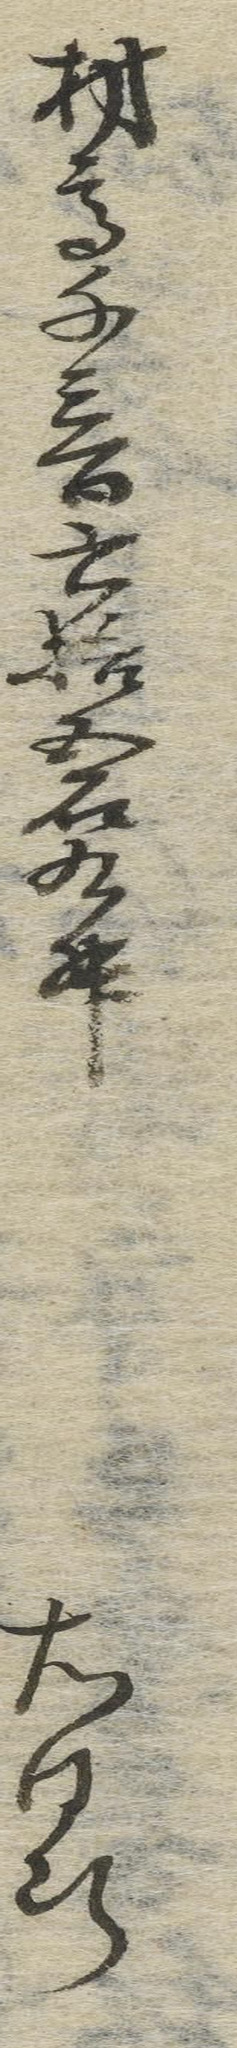村高千三百六拾五石九升右同断
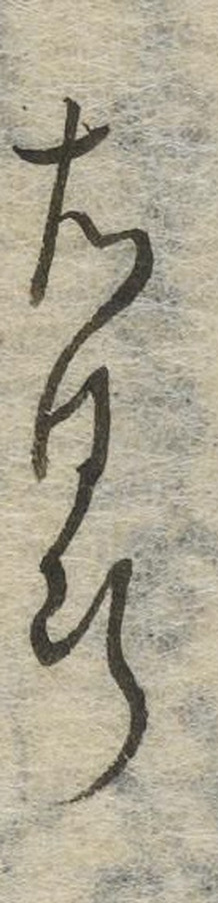右同断
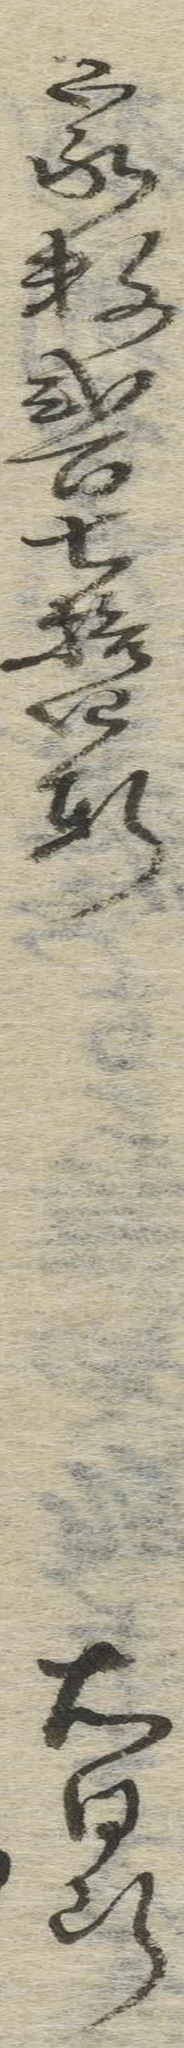家数二百七拾四軒右同断
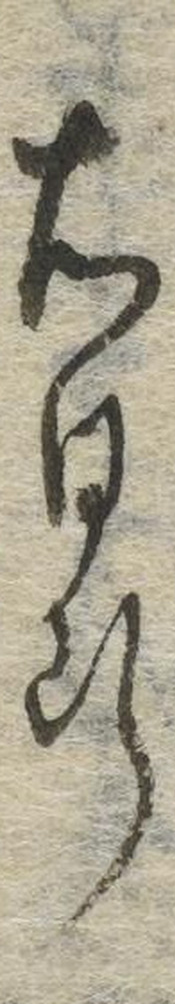右同断
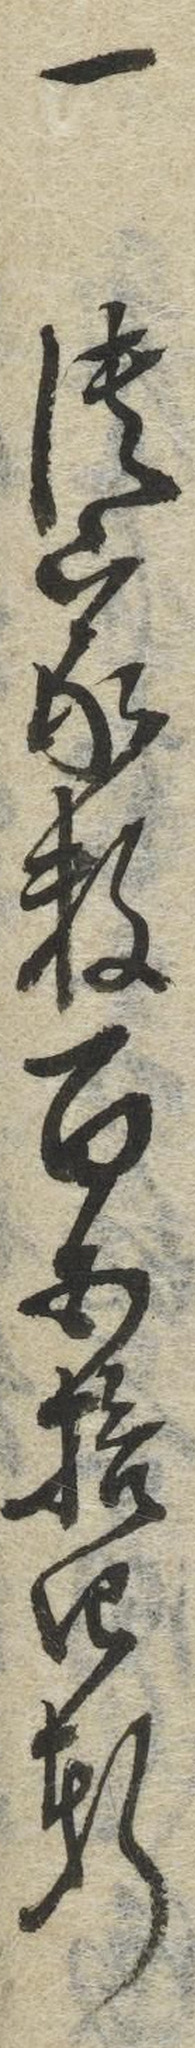一潰家数百五拾四軒
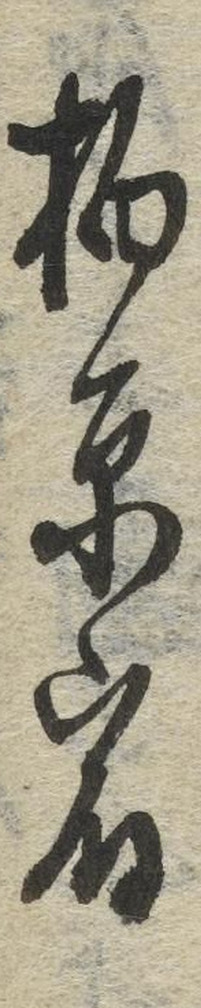柏原宿
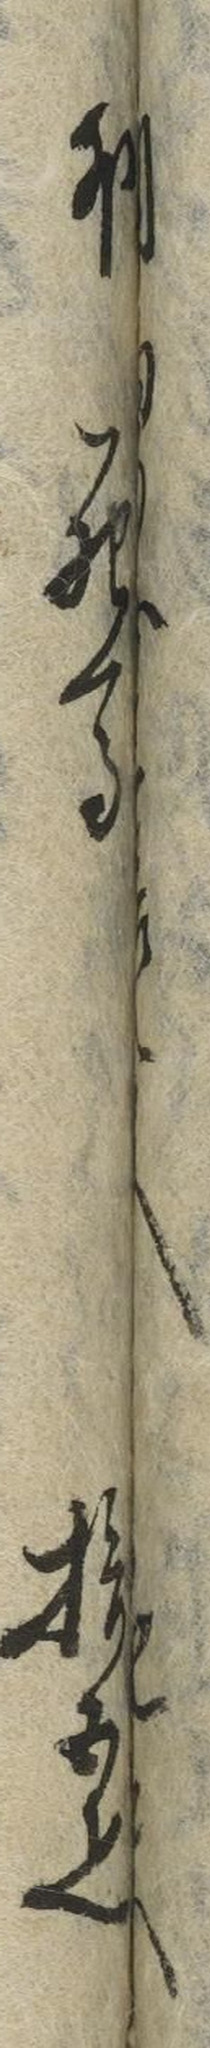外死馬拾五疋
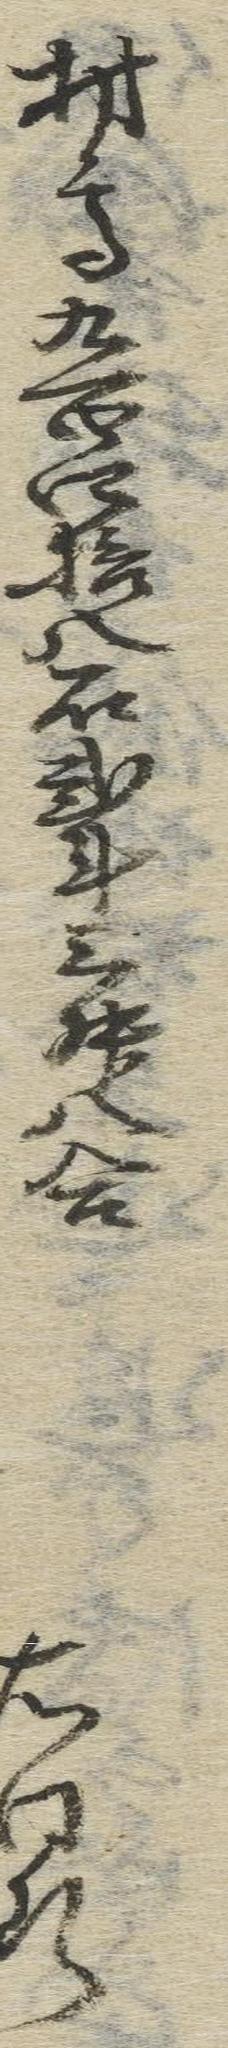村高九百四拾八石弐斗三升八合右同断
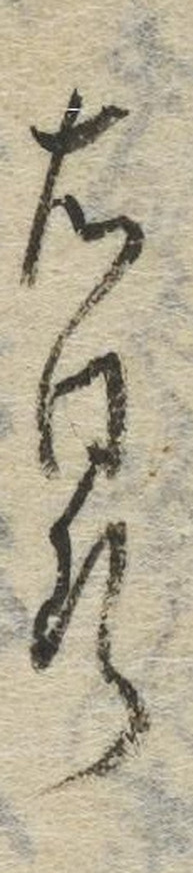右同断
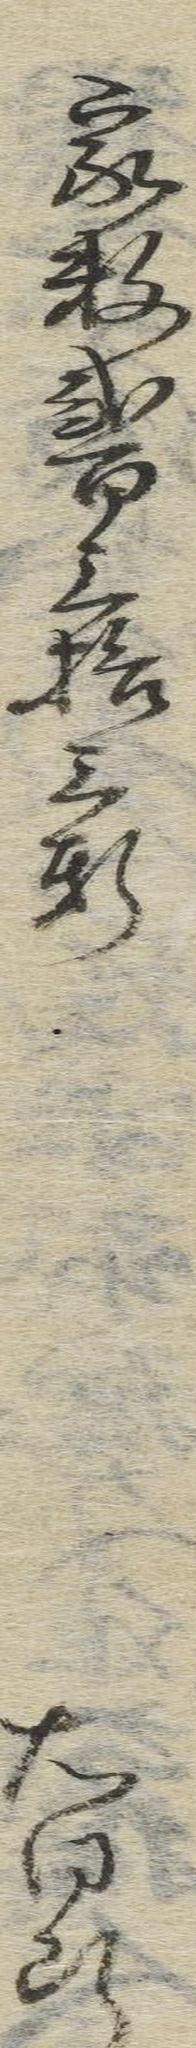家数弐百三拾三軒右同断
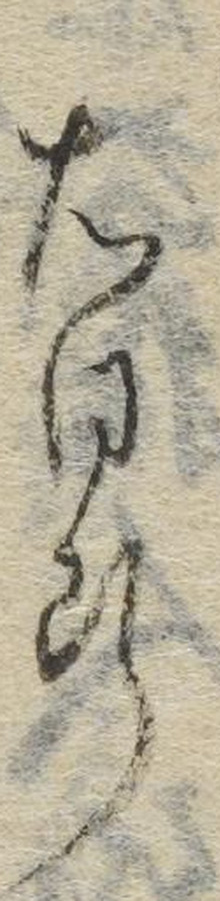右同断
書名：信濃越後　地震書留
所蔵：東京大学地震研究所図書室 Earthquake Research Institute Library, The University of Tokyo, JAPAN
